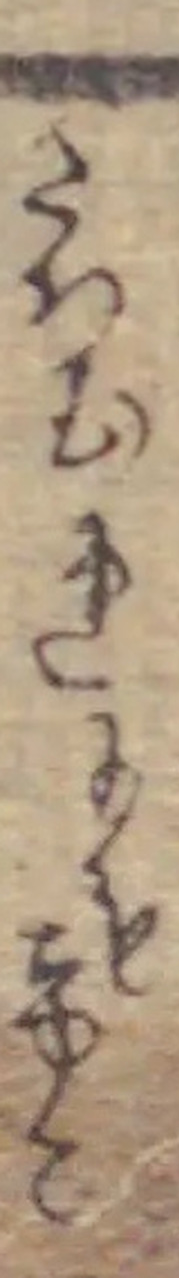たはむれにもけこ
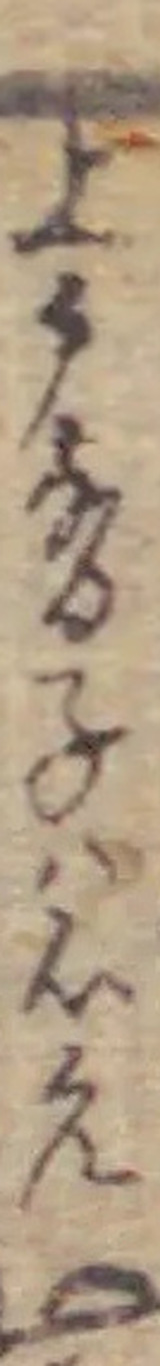上戸なる子は心元
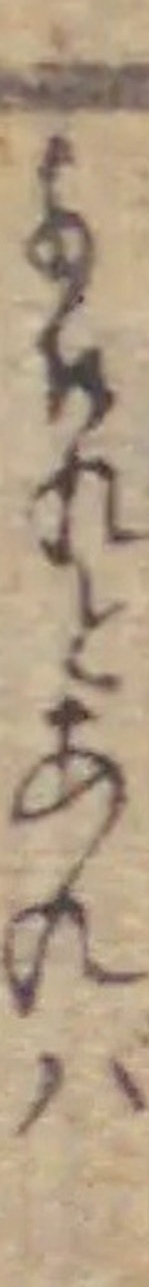よけれとあれば
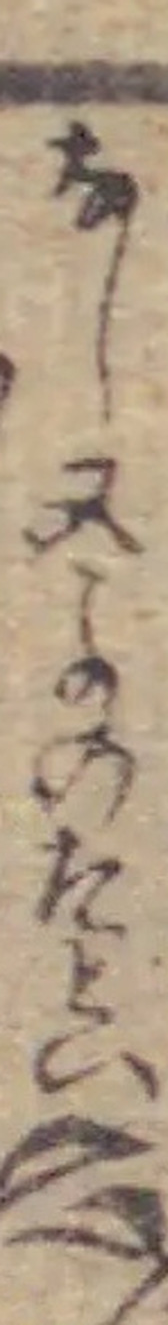なし又よのたとい
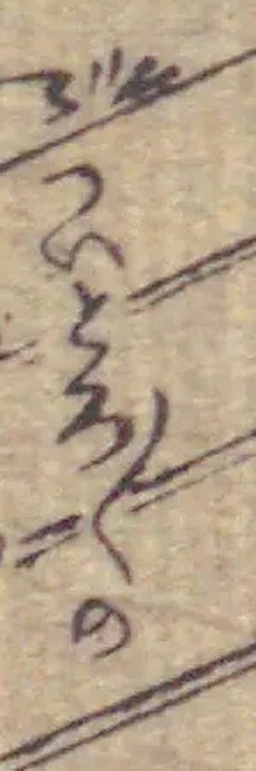ついとろ〳〵の
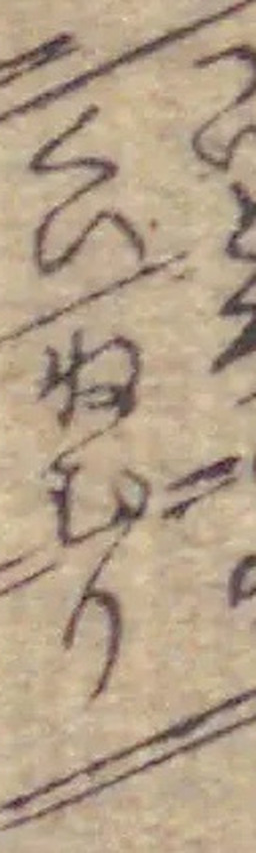くいねむり
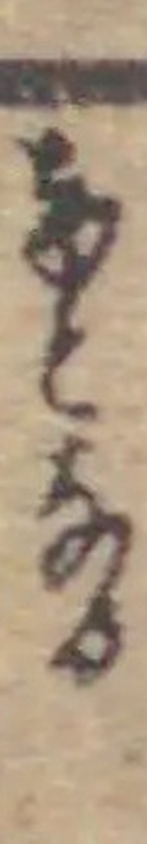けこなる
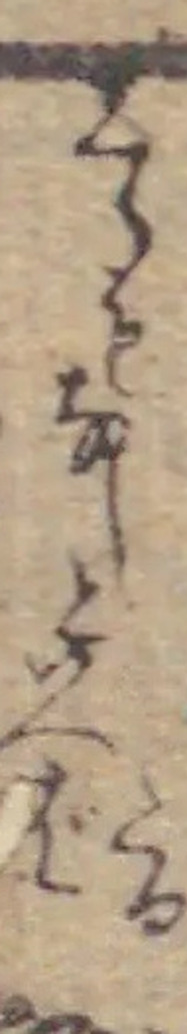くらもなしといへば
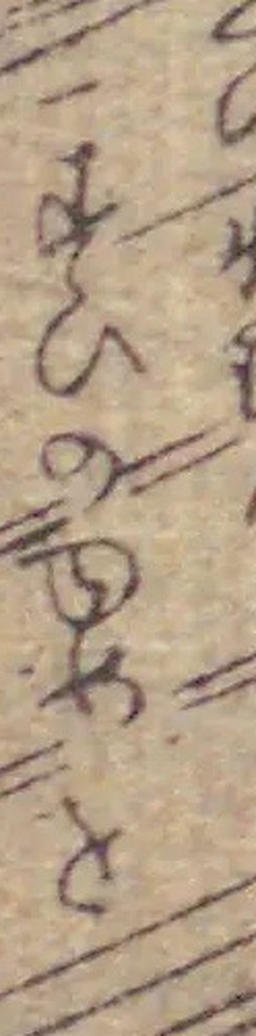一すいのゆめを
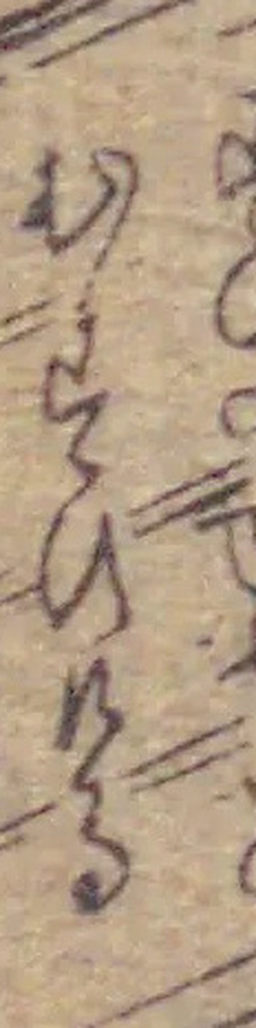むすひける
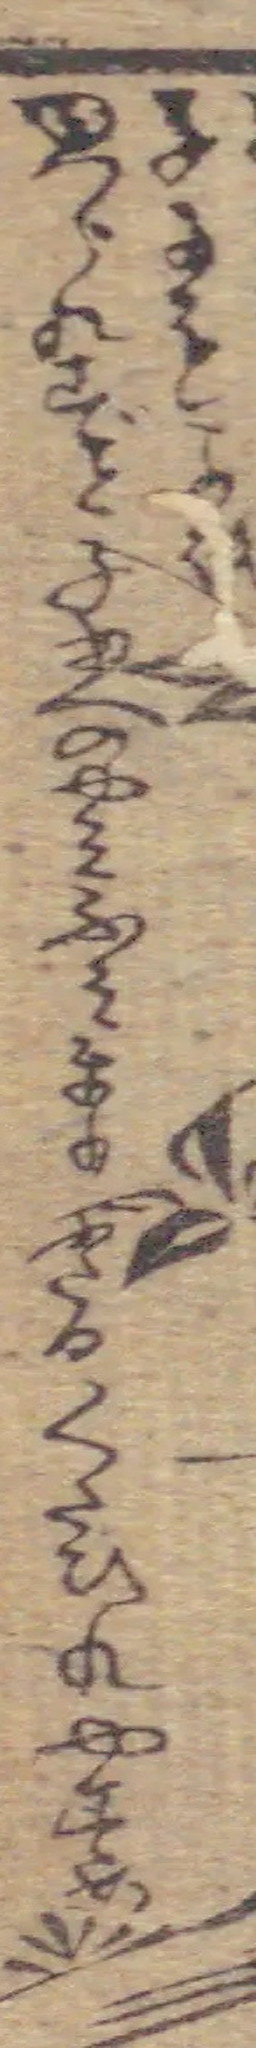ゆづられずと子ゆへのやみふみまよいたるくたひれやすめ
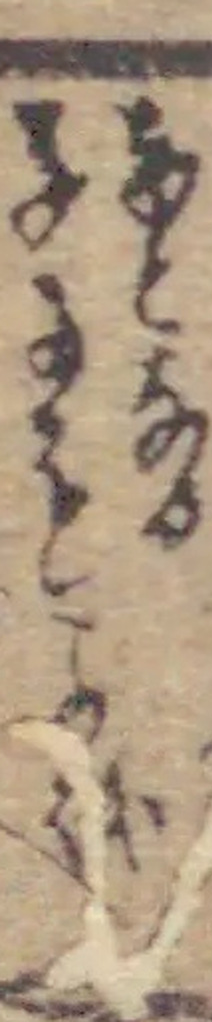子にもよを

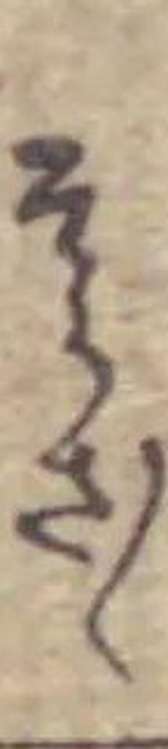そうさ〳〵
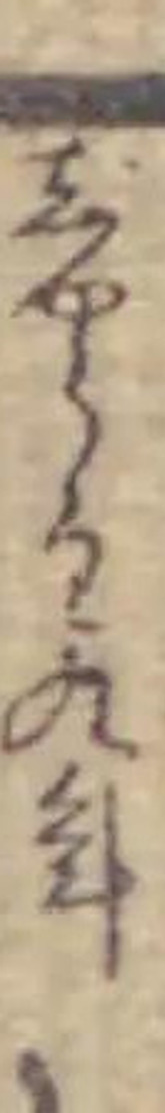しやう主九年
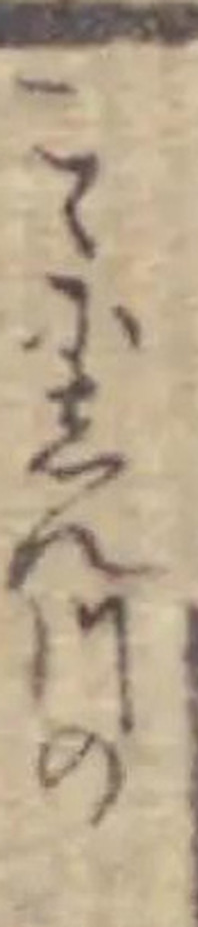こゝにしん川の
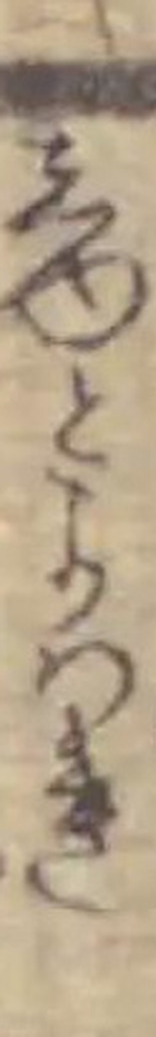しゆとよはれ
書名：餅酒腹中能同志 2巻
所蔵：国立国会図書館 National Diet Library, JAPAN
